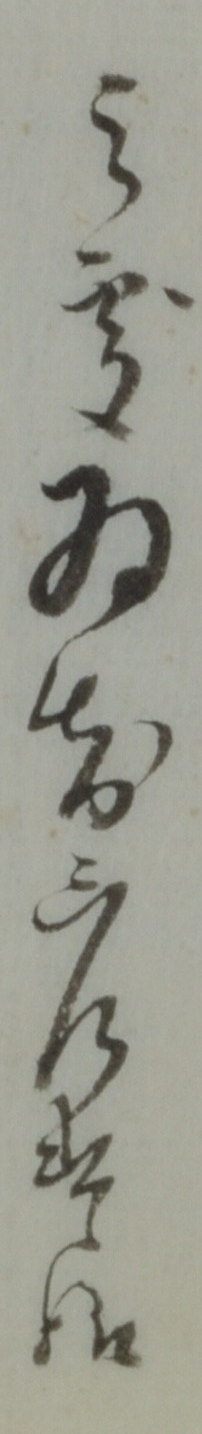之処為知差遣候様
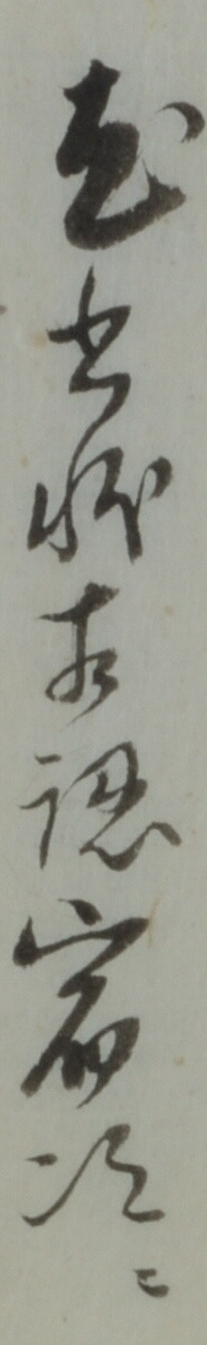尤書状相認宿次ニ
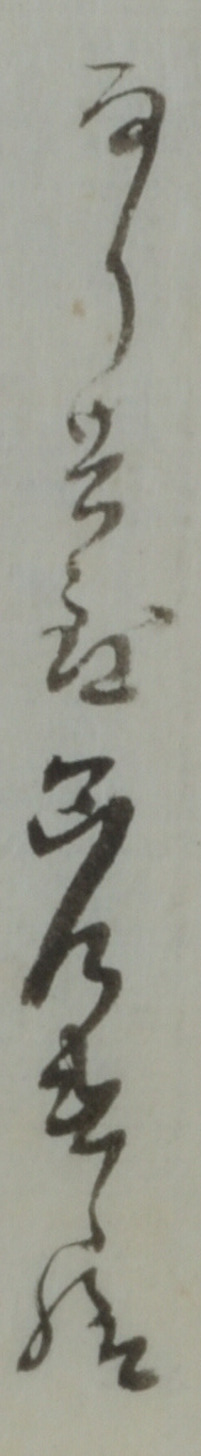なり共致差遣候様
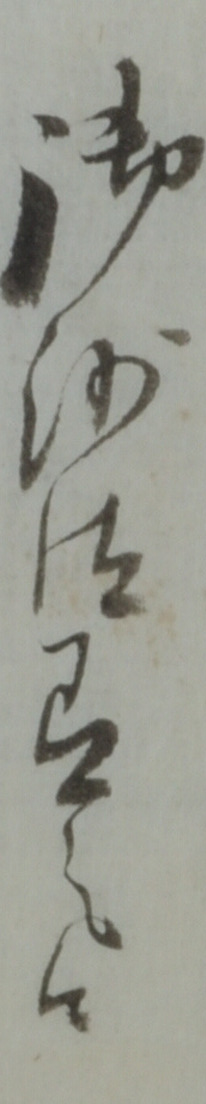御沙汰有之候

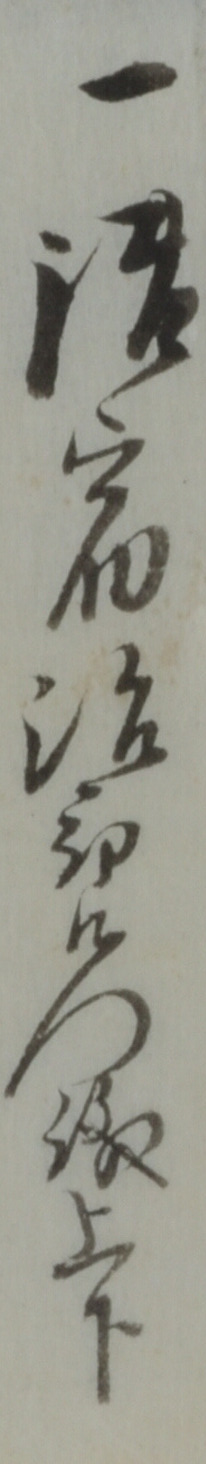一御宿治郎左衛門儀上下
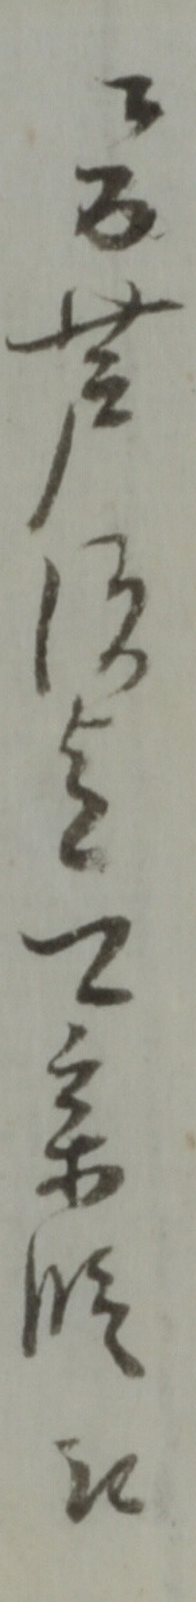ニ而芦沢迄可参段被
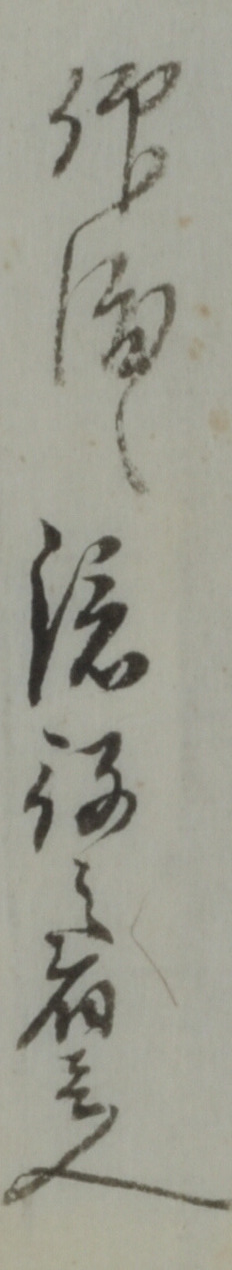仰渡候添役之者壱人
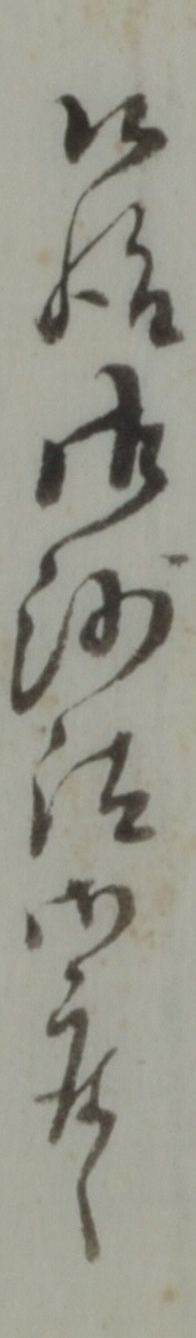候様御沙汰御座候
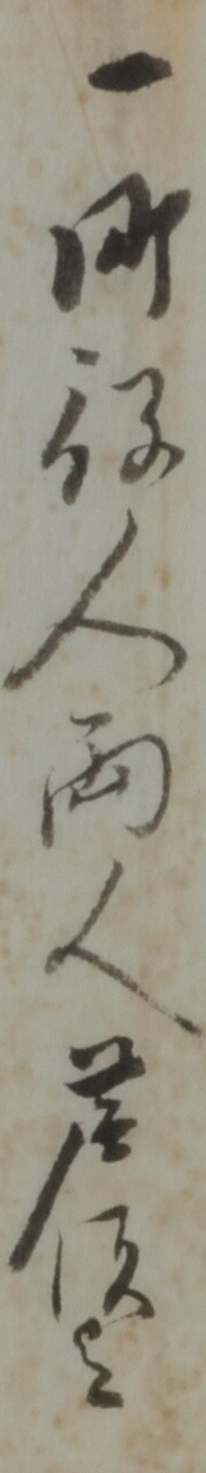一町役人両人芦沢迄
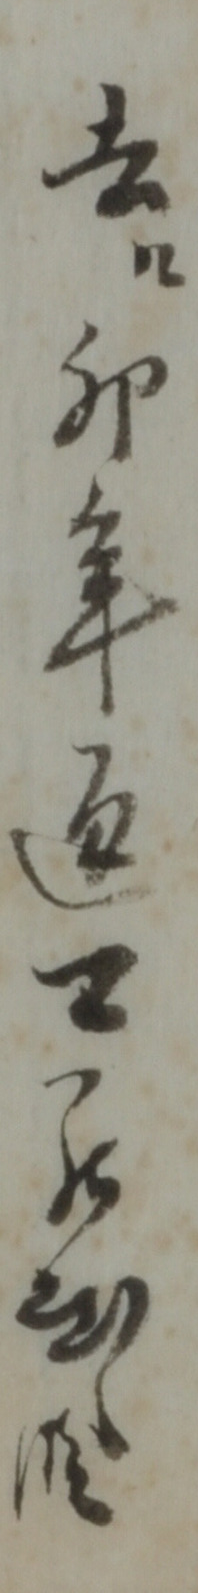去ル卯年通可罷出候段
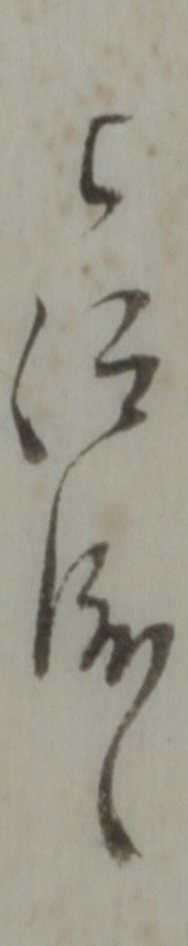被仰渡候
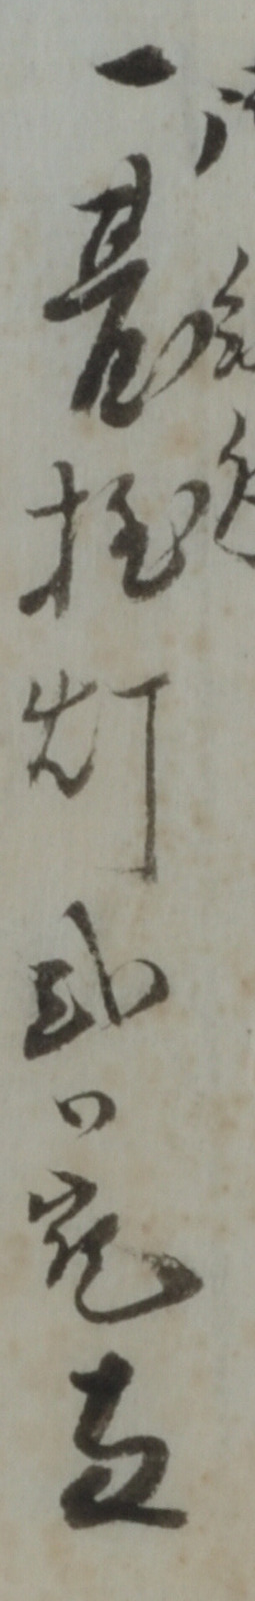一台挑灯弐口宛両
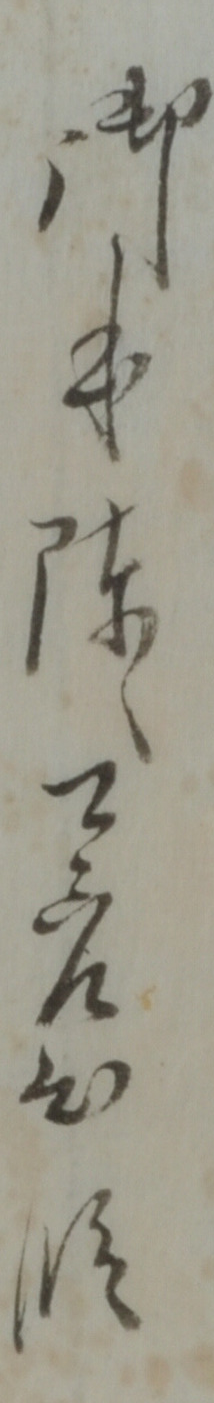御本陣へ可差出段
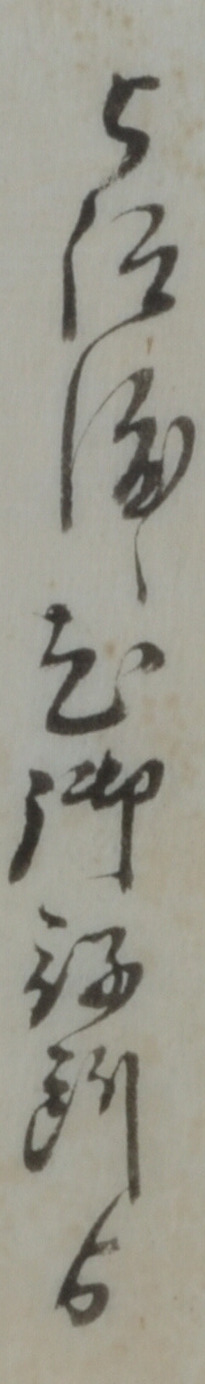被仰渡候尤御役所ゟ
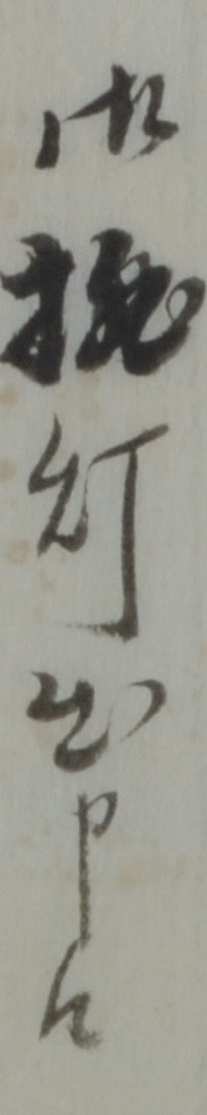御挑灯出申候

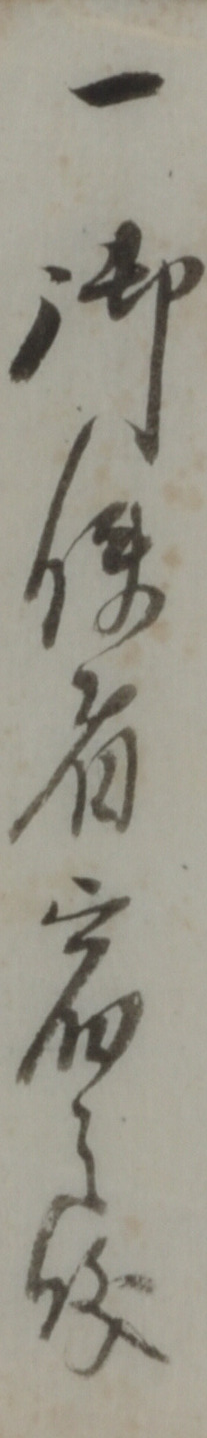一御使者宿之儀
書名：御勘定御普請役江戸御役人様諸事控
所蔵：伊那市立高遠町図書館・合同会社AMANE
